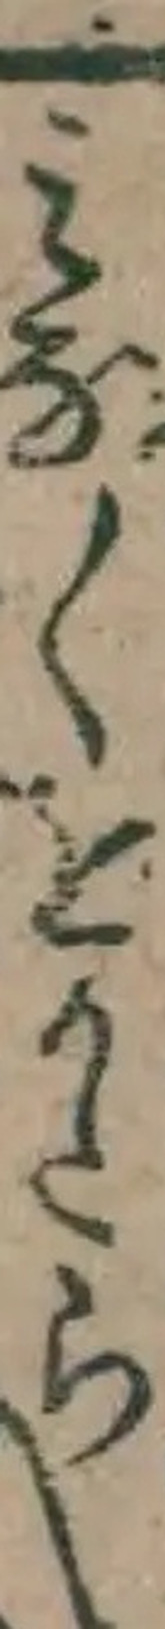みな〳〵をかたら
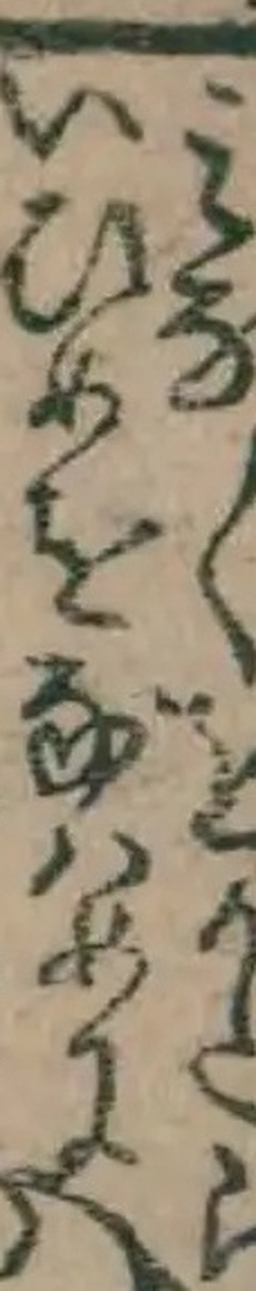いひめをなはめに
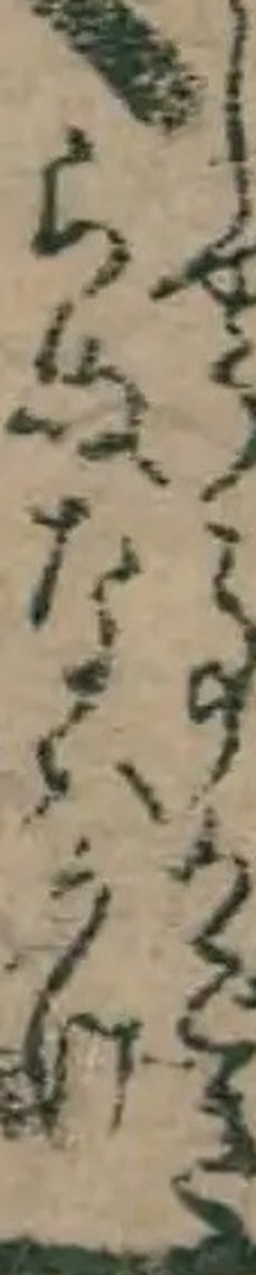らぬなはかけ
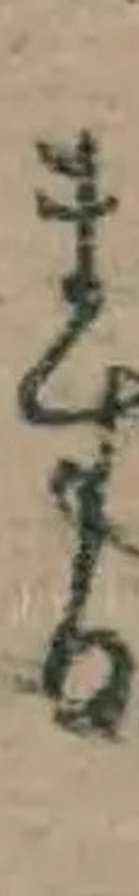まする
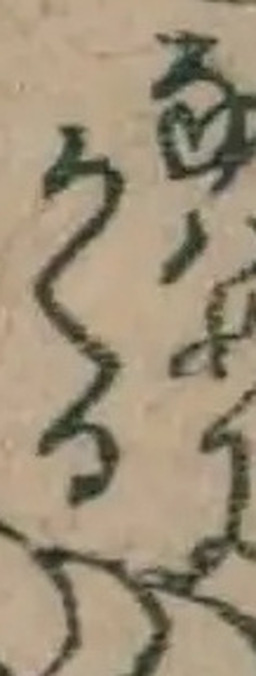かくる
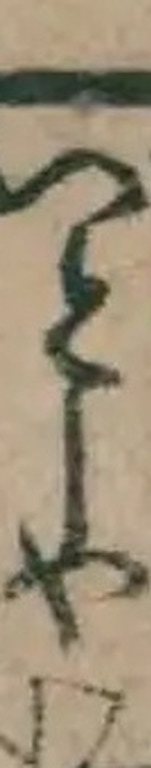いとしや
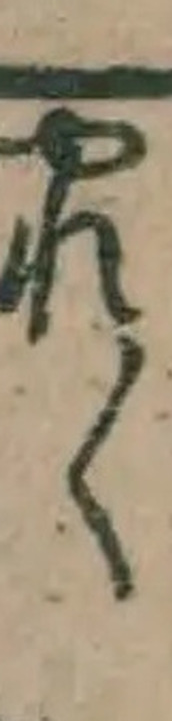やれ〳〵
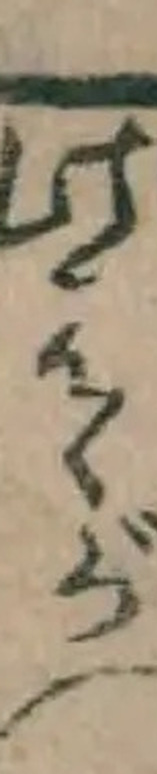此はゝが
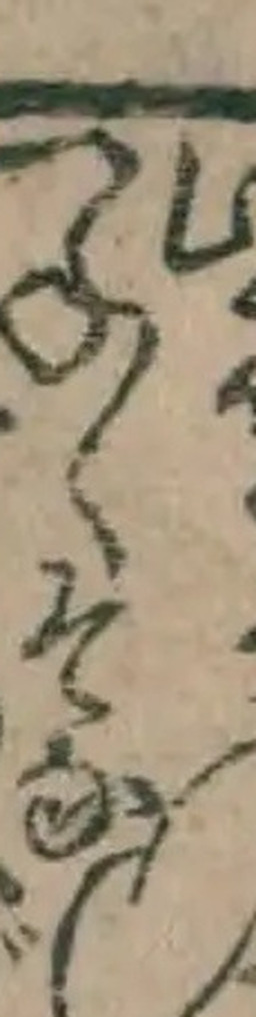つね〳〵そな
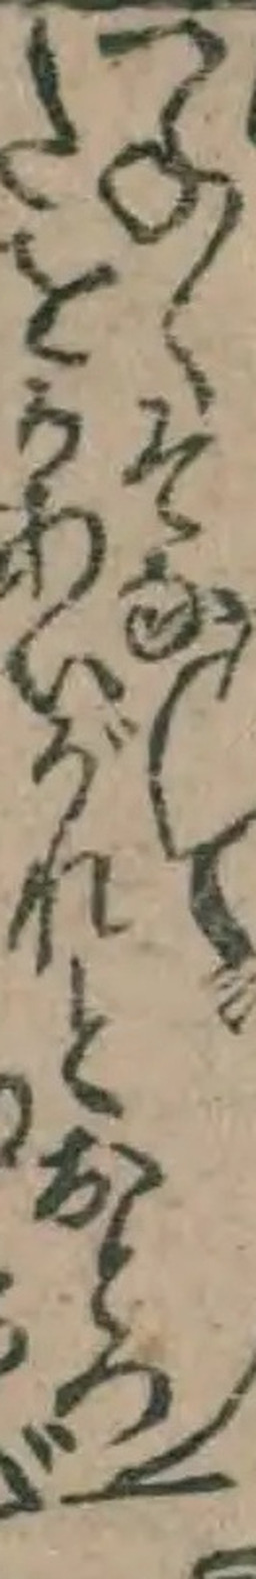たをかあいがれとおとつ
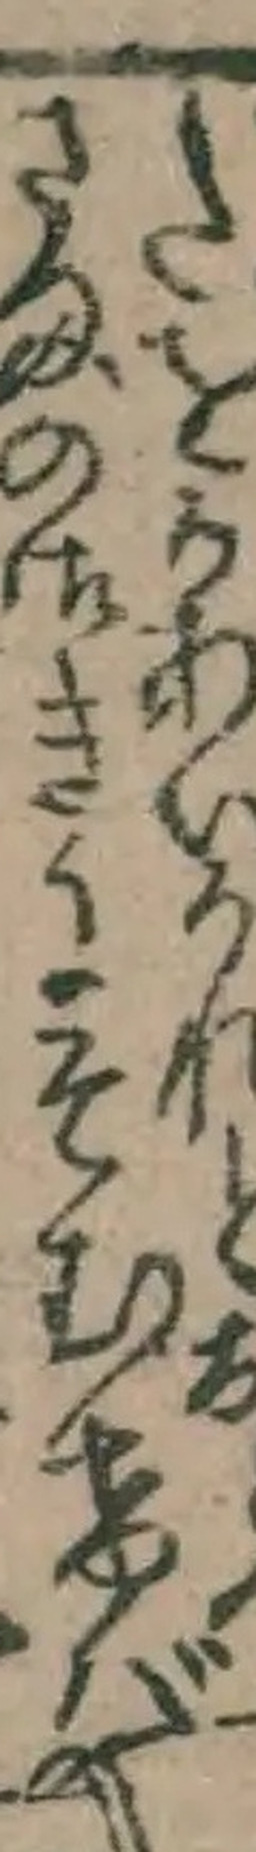さまの御きにそむけば
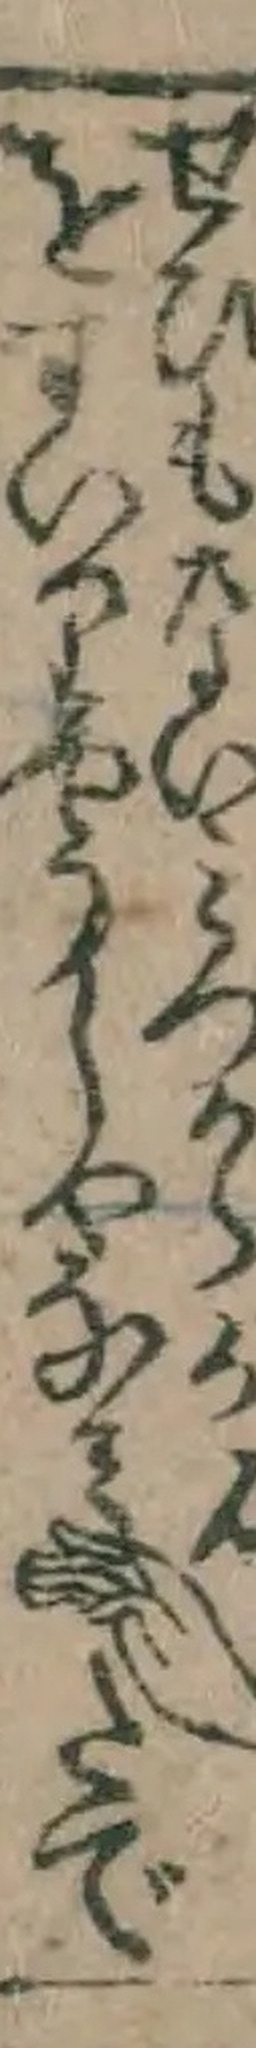をすいりやうしやなみたで
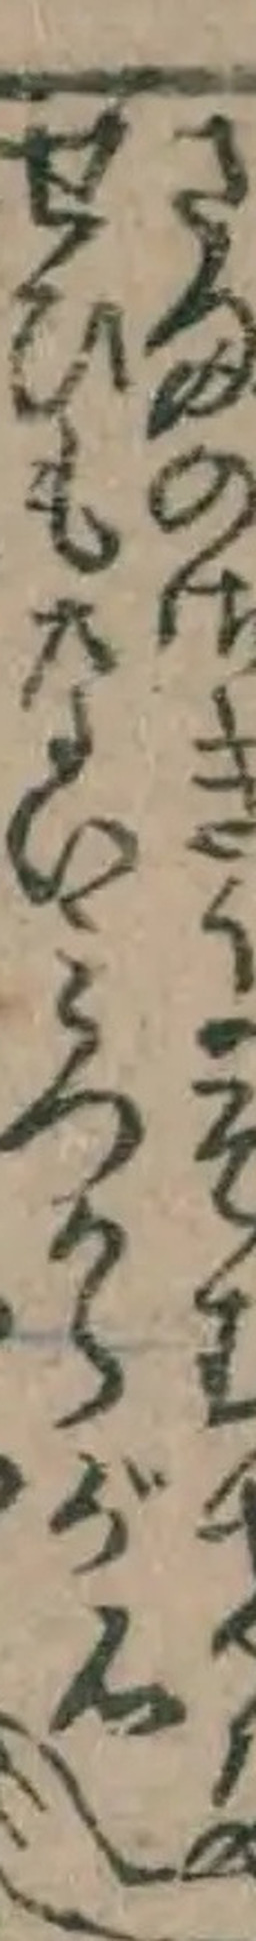せひもないみつからが心
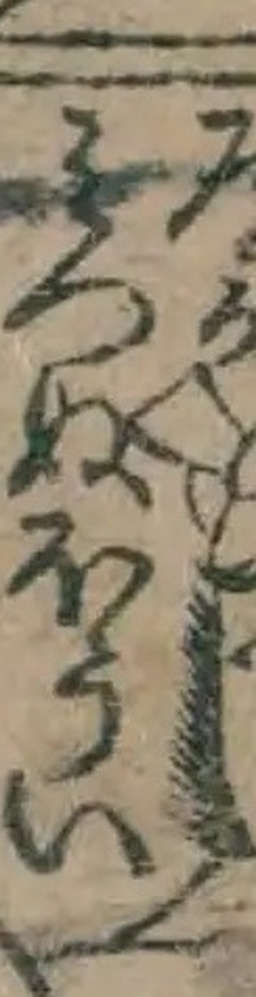みつぬほうい

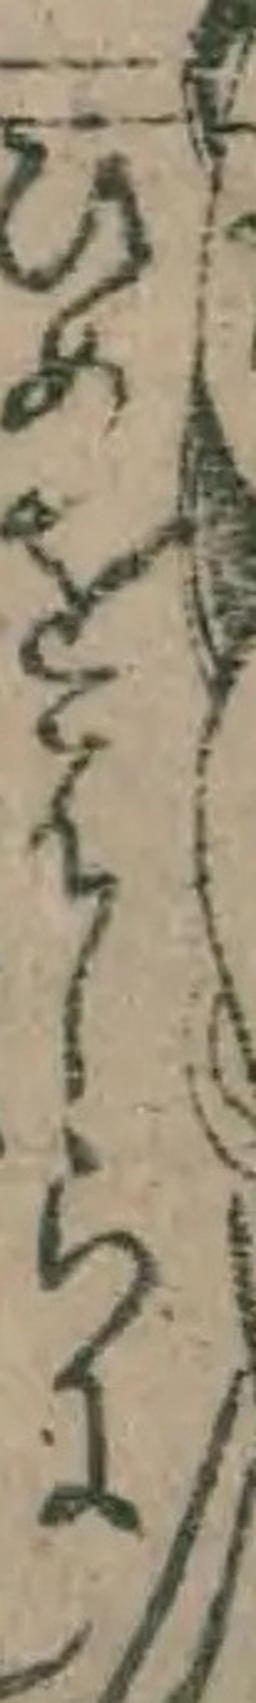ひめをはしらに
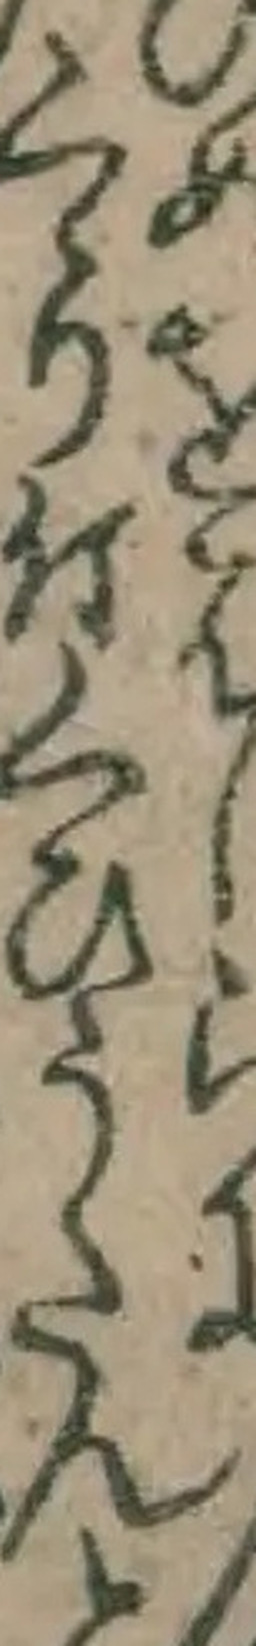くゝり付くひうたんと
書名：団十郎蓬芥伝
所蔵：国立国会図書館 National Diet Library, JAPAN
